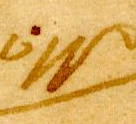M^r.
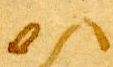To
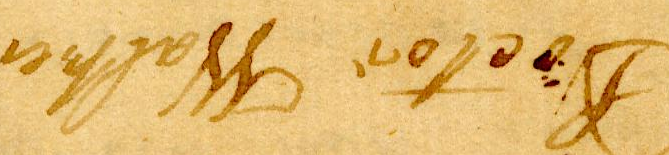Doctor Walker
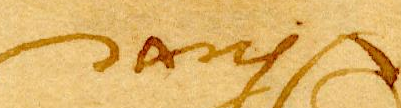These
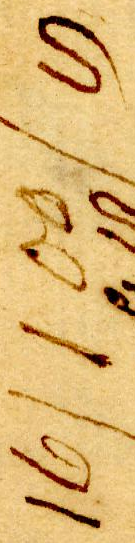16 / 100 / 4
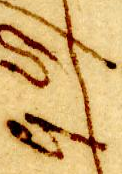94
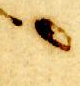0
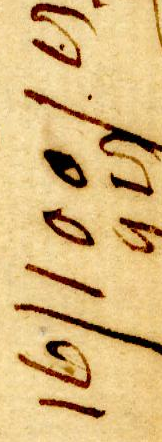16 / 100/ 9
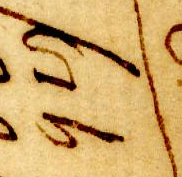94
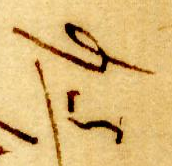56
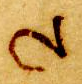2
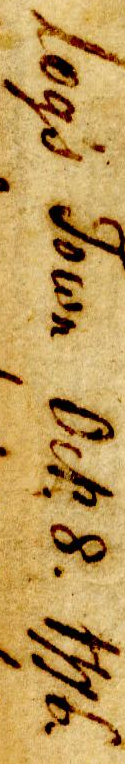Log's Town Oct. 8. 1776.
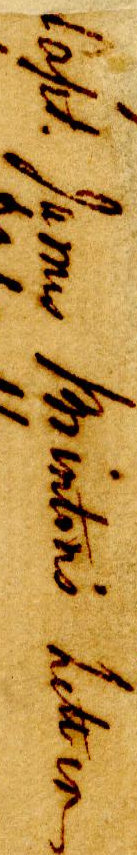Capt. James Brinton's Letter
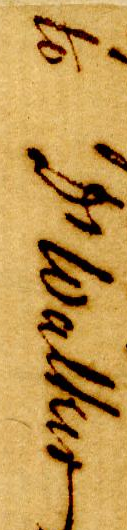to D^r Walker
